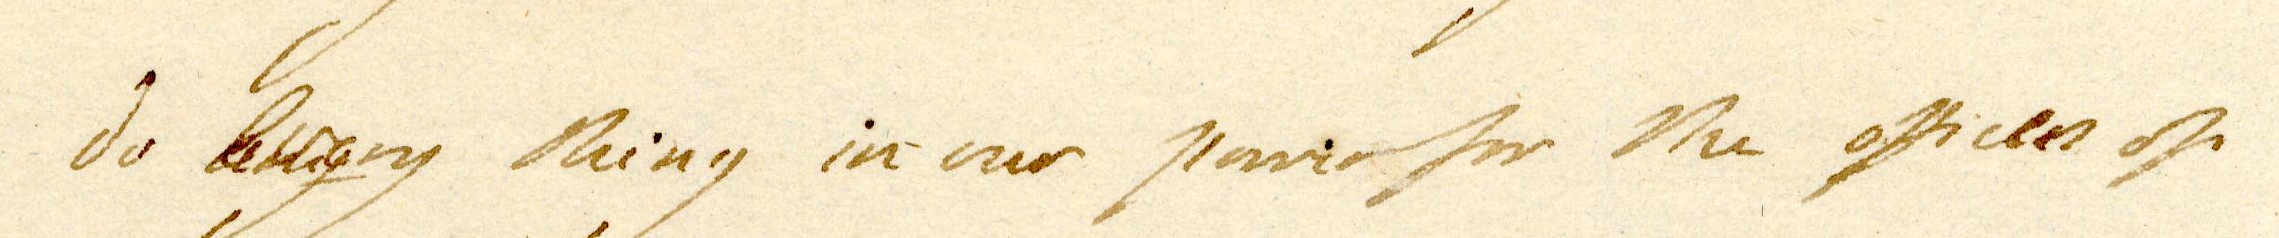do Every thing in our power for the offices of
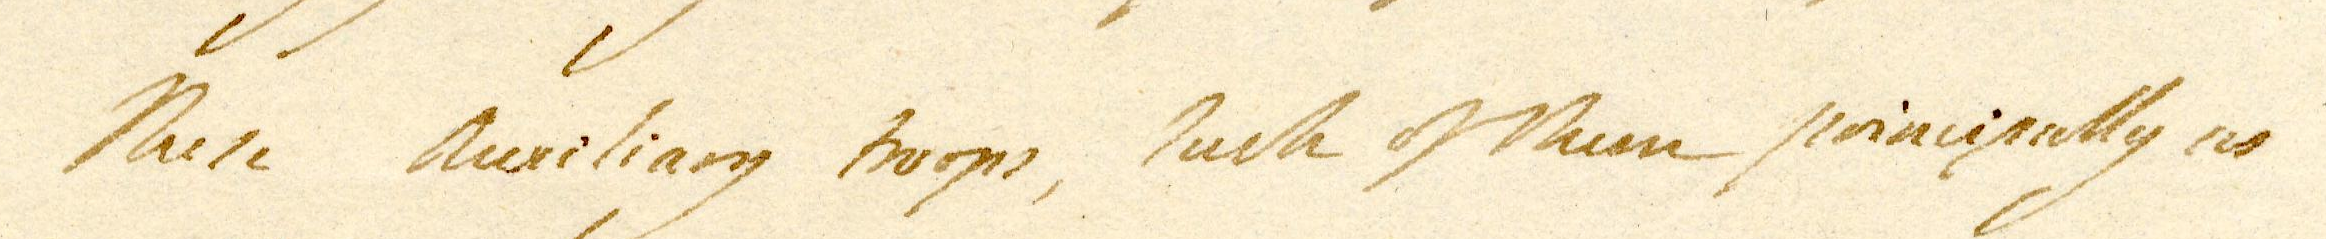these Auxiliary troops, such of them principally as
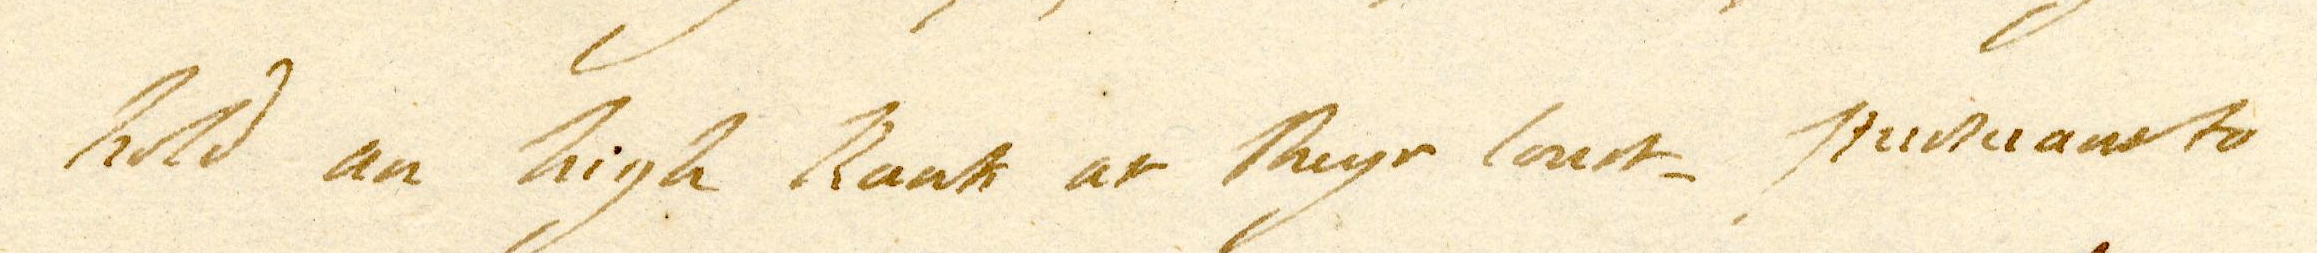hold an high Rank at theyr Court persuant to
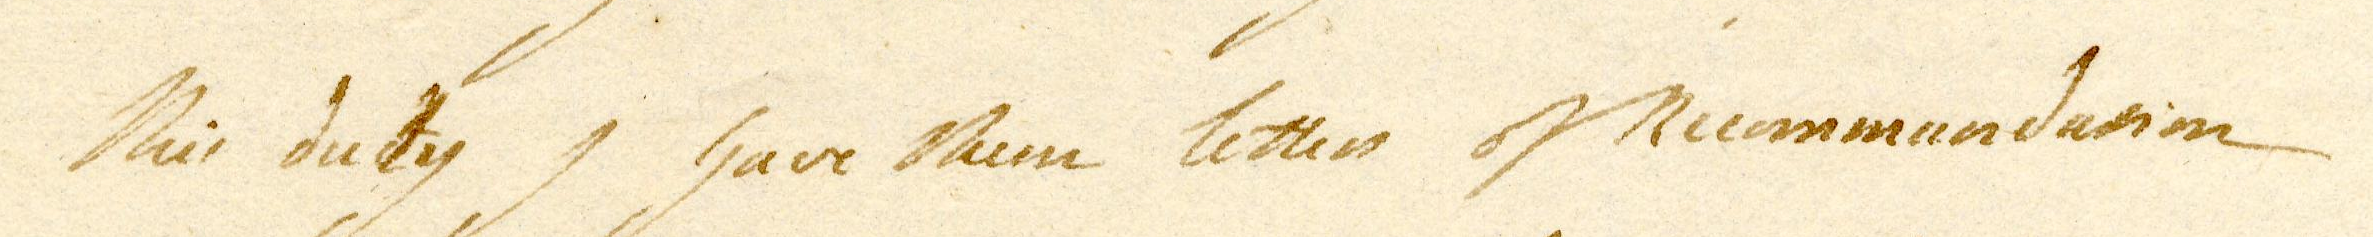this duty I Gave them letters of Recommendation
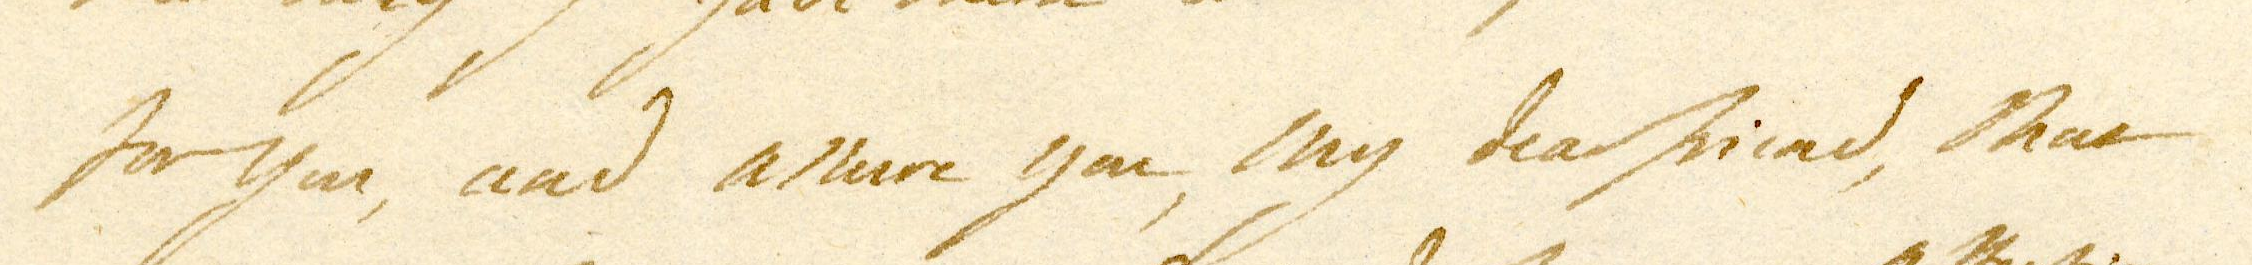for you and allure you my dear friend that
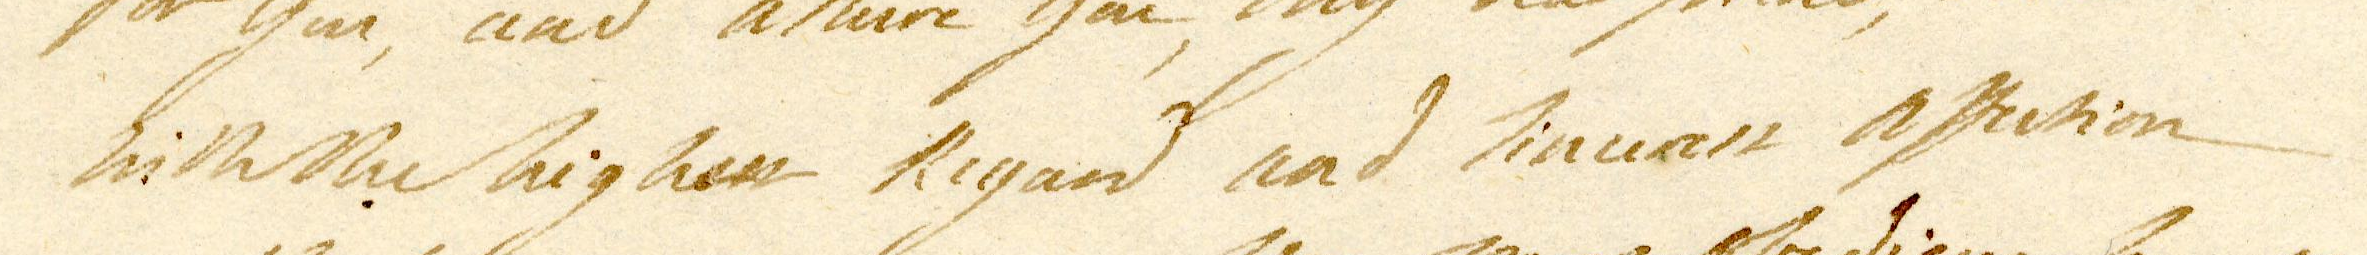with the highest Regard and sincerest affection
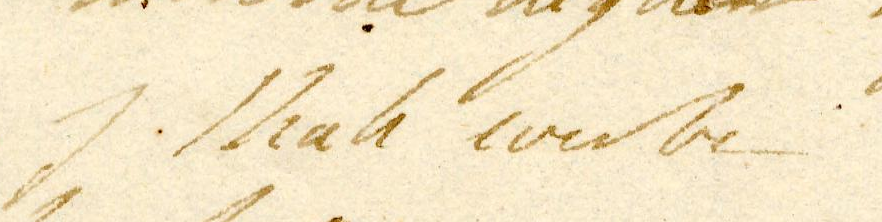I shall ever be
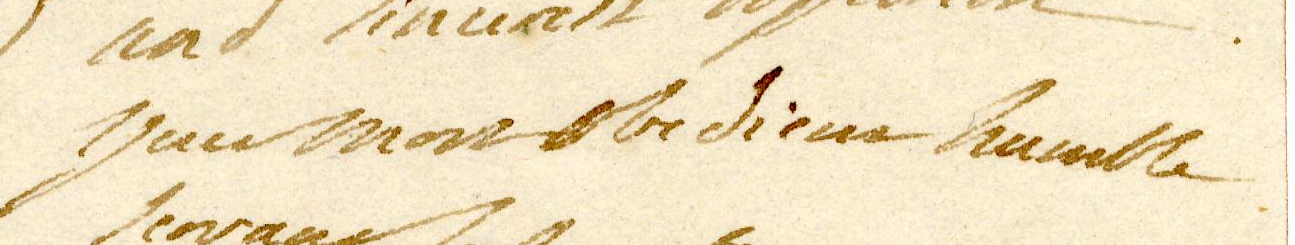your most obedient humble
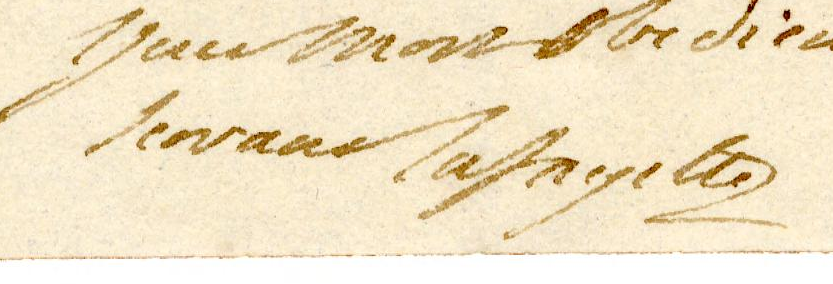servant lafayette
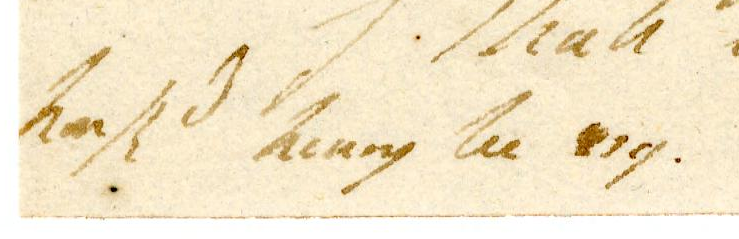hon R^d henry lee esq.
